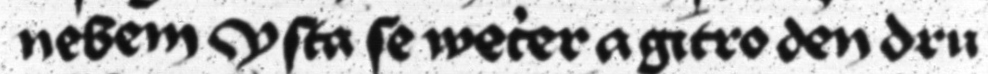nebem Yſta se weċer a gítro den dru
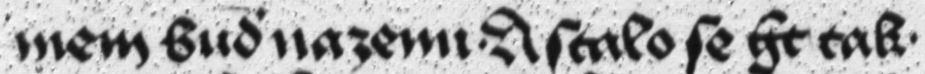mem buḋ nazemi. A ſtalo ſe ḡt tak.
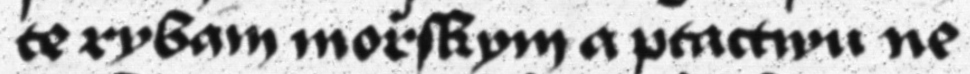te rybám moṙſkym a ptactwu ne
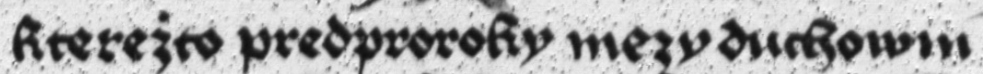ktereżto predproroky mezy duchowní
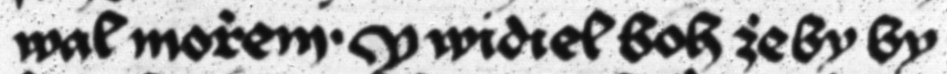wal moṙem. Y widiel boh że by by
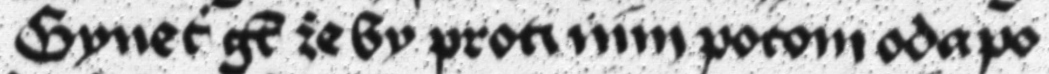Gyneṫ ḡt że by proti ṅím potom oda po
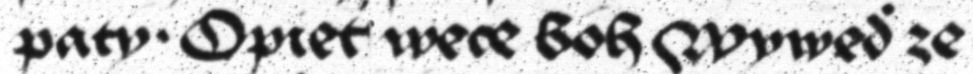paty. Opiet wece bóh Wyweḋ ze
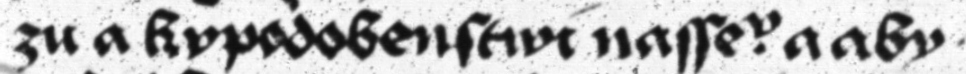zu a kvpodobenſtwí naſſev a aby
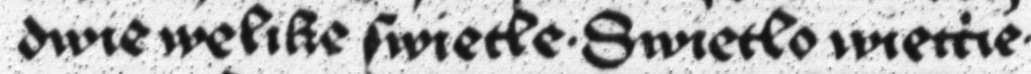dwie welike ſwietle. Swietlo wietċie
